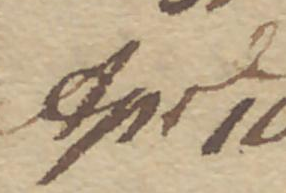Apr^l 10
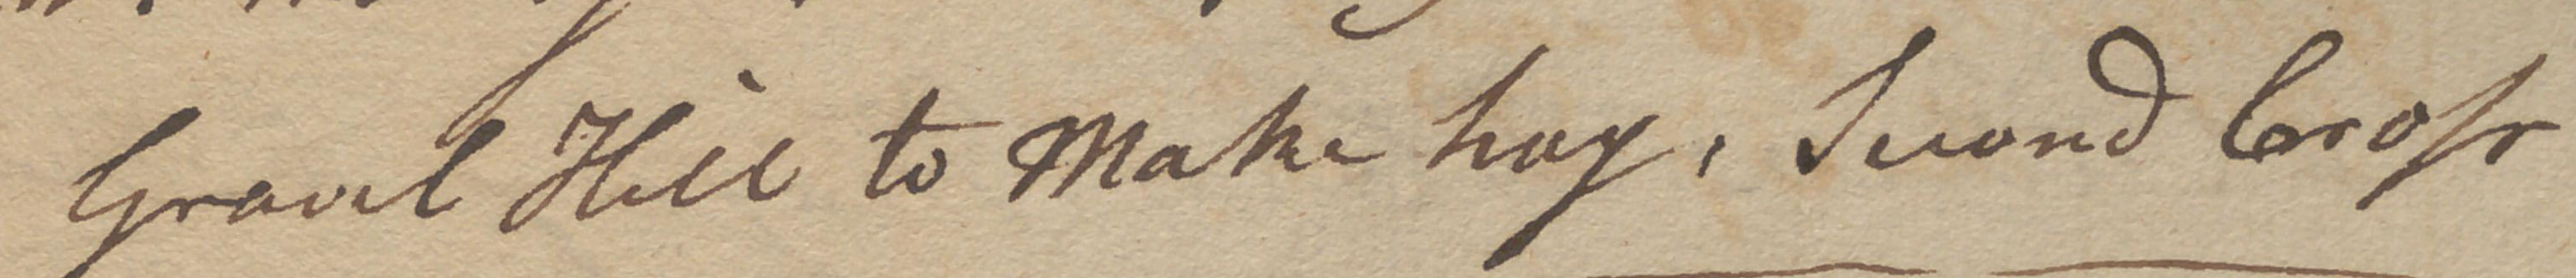Gravel Hill to Make hay, second Crop
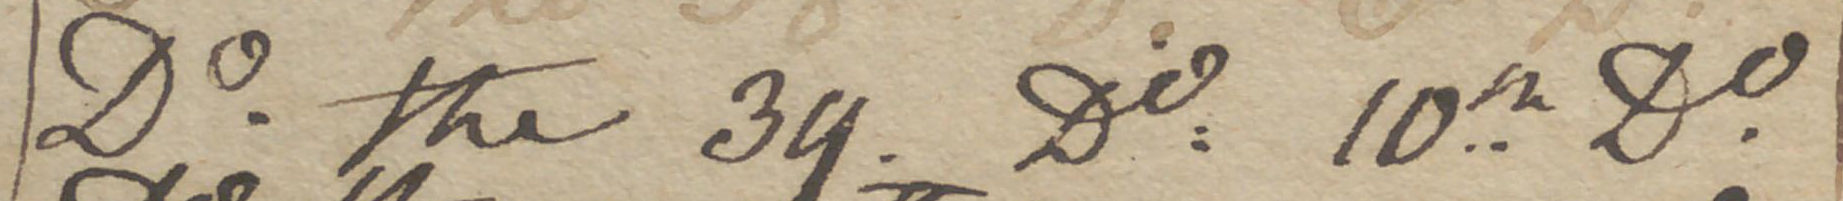D^o. the 39. D^o. 10^th. D^o.
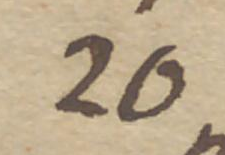20
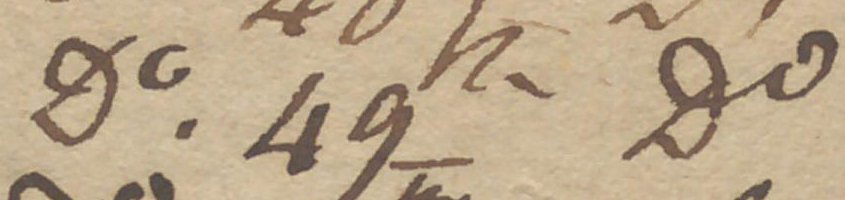D^o. 49^th D^o
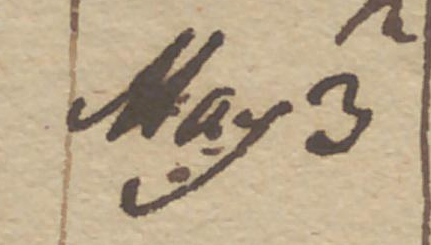May 3^th
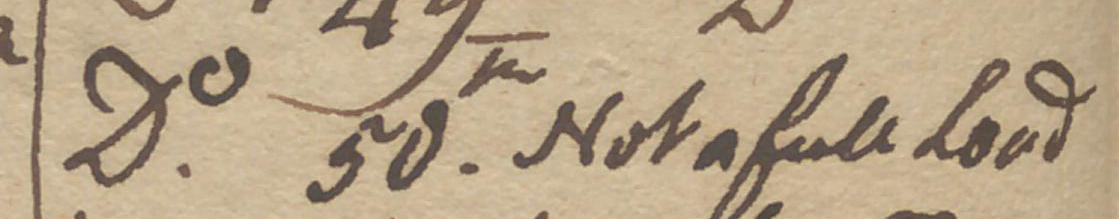D^o. 50^th. Not a full Load
